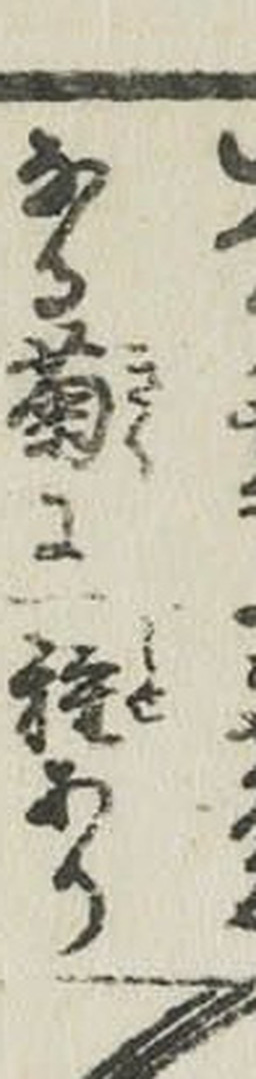なる菊に一種あり
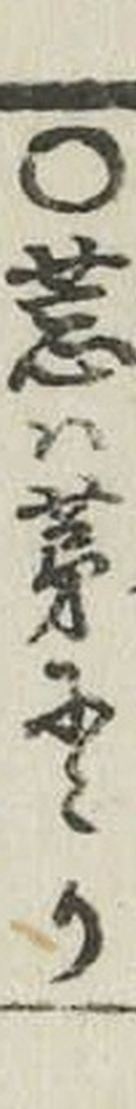○莣は茅にゝたり
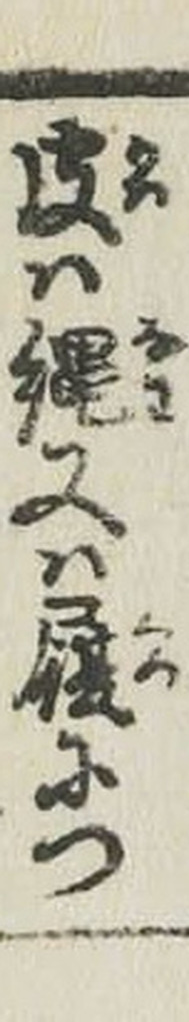皮は縄又は履につ
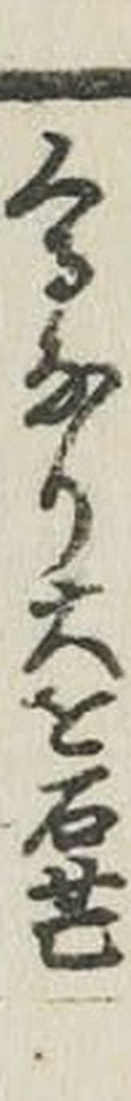くるなり大を石芒
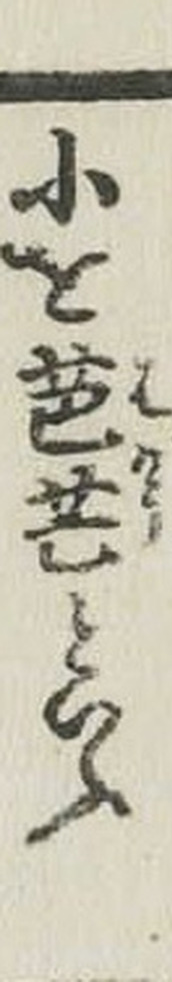小を芭芒といふ
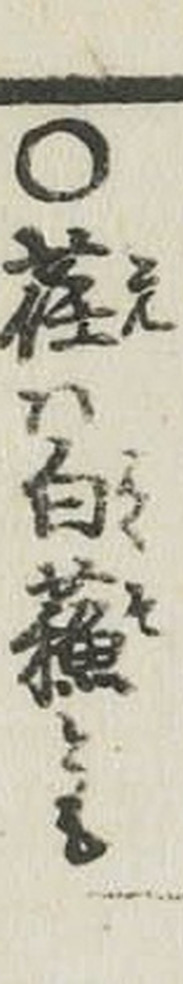○荏は白蘇とも
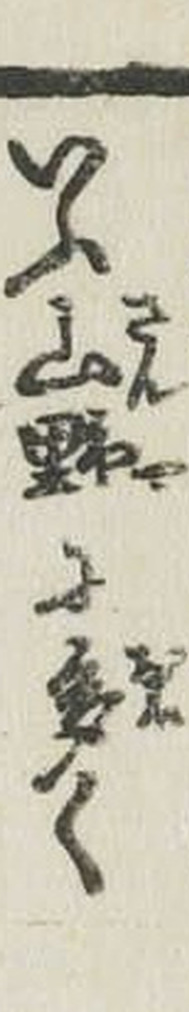いふ山野に多く
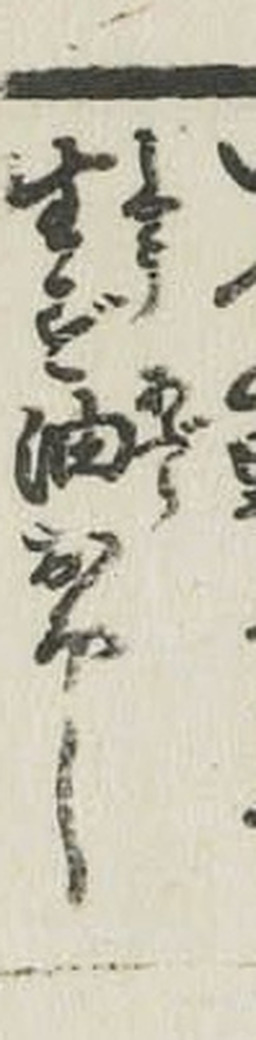生ず油おほし
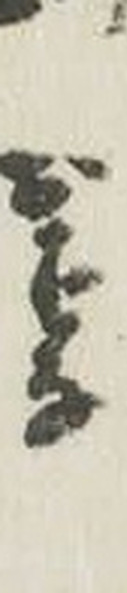おばな
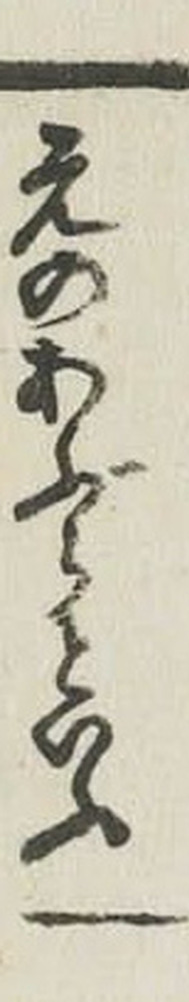えのあぶらといふ
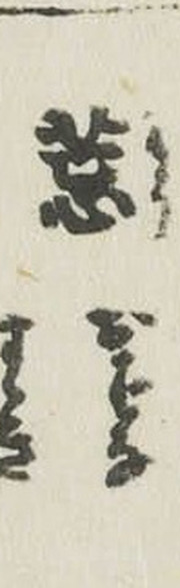おばな
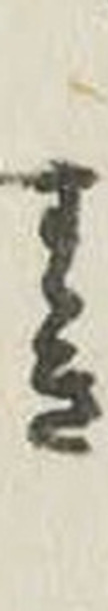すゝき
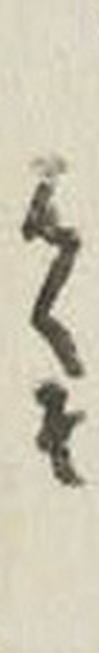はくそ
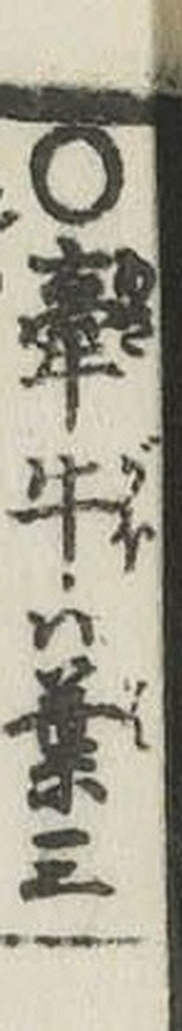○牽牛は葉三
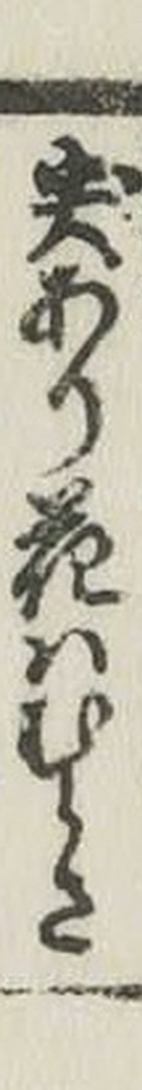尖あり花はむらさ
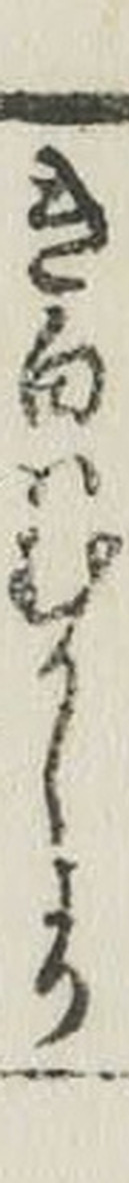き白はむかしより
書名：増補頭書訓蒙図彙大成 10巻 9:巻之20
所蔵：東京学芸大学教育コンテンツアーカイブ
